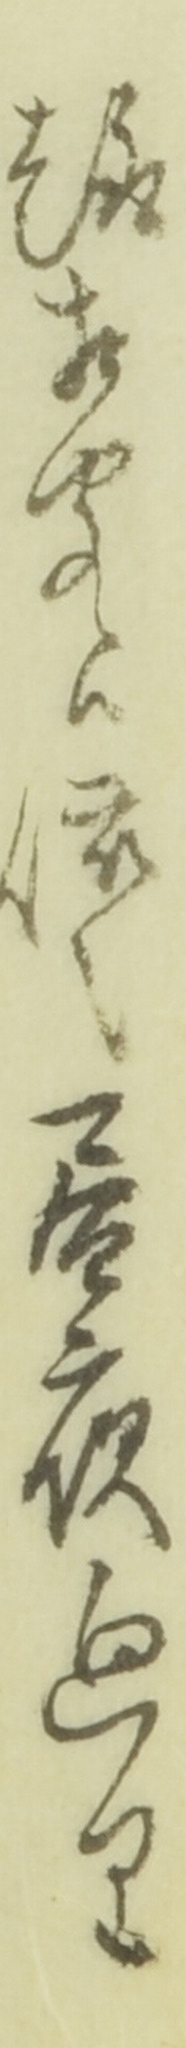趣相聞候依之昼夜廻り
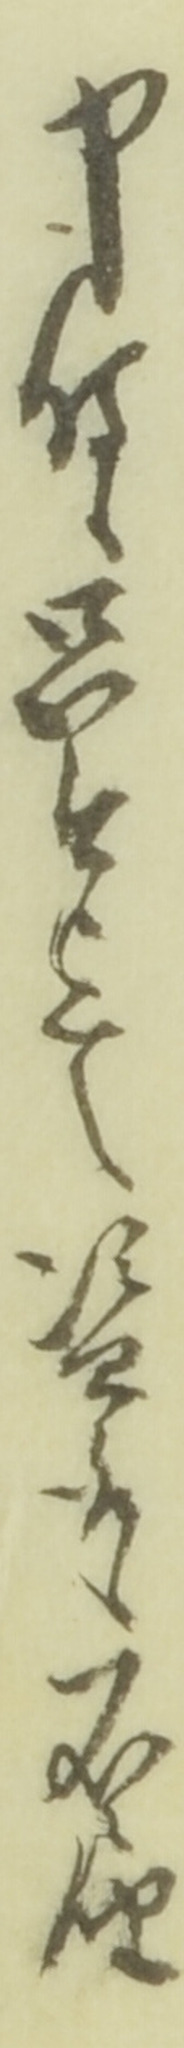申付候只今迄之盗取候不届
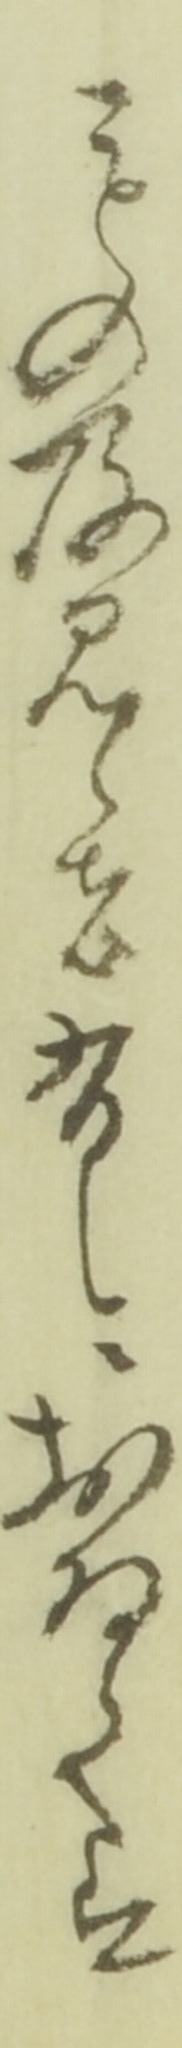もの及見候者有之二おなじく者
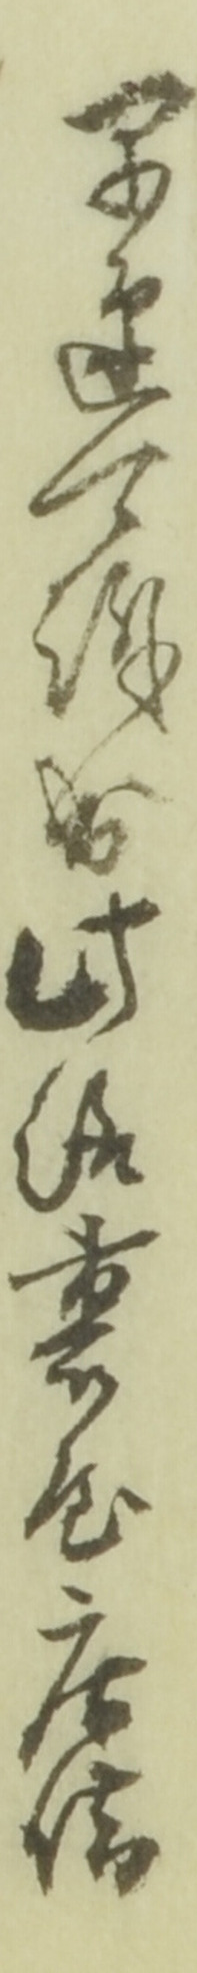早速可訴出此の趣裏屋店借
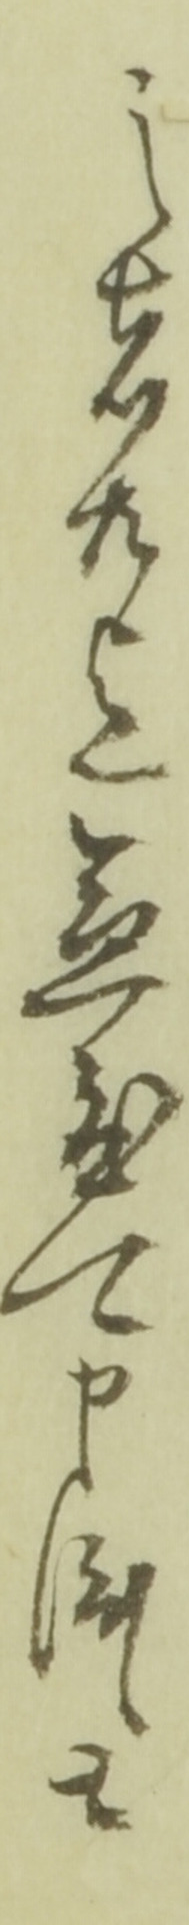之者共迄急度可申渡候以上
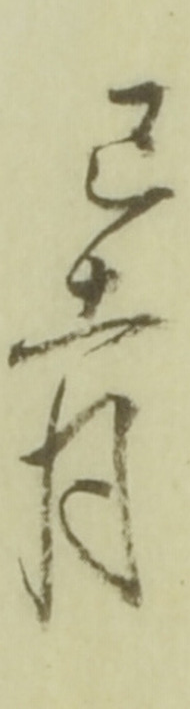巳十一月
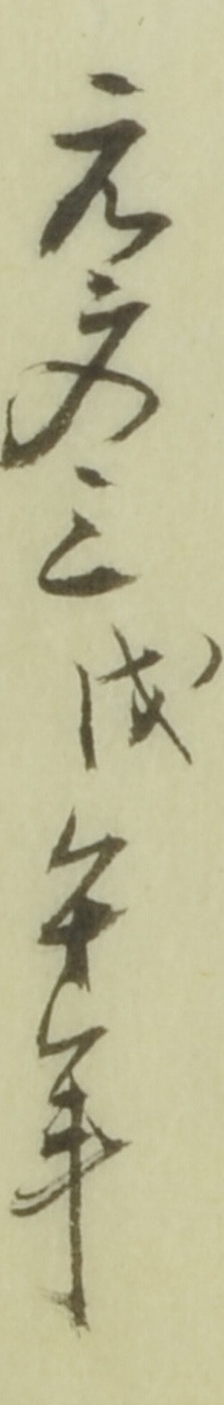元文三戌午年
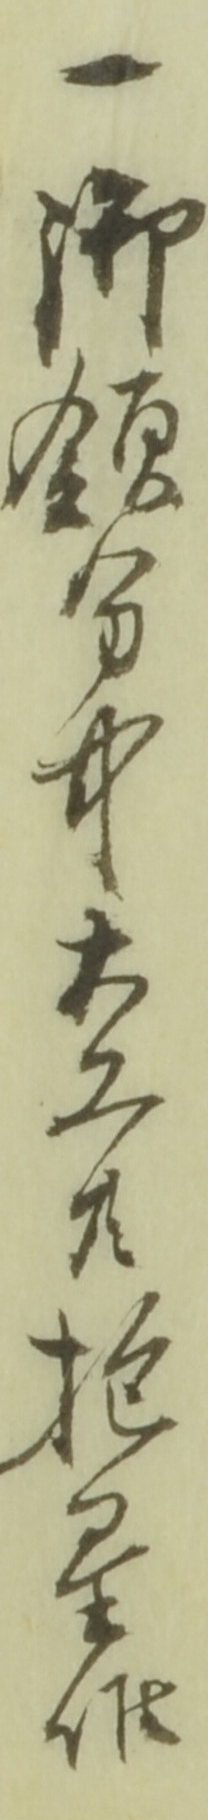一御領分中大工共抱置候
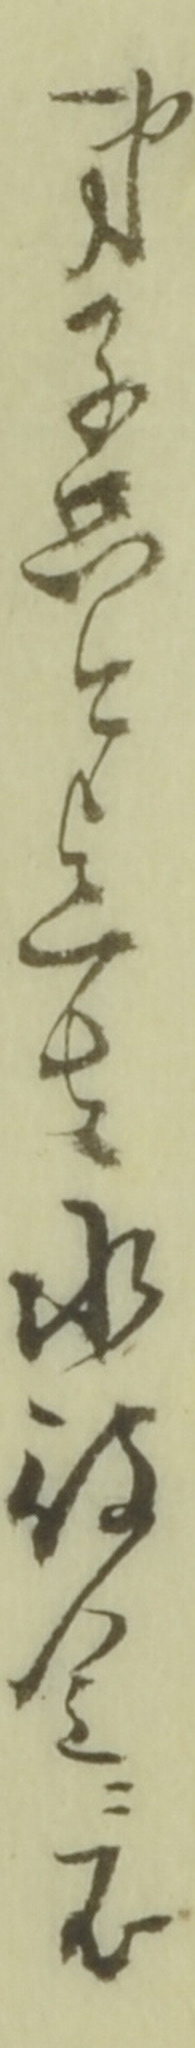弟子只今迄者水役金二不
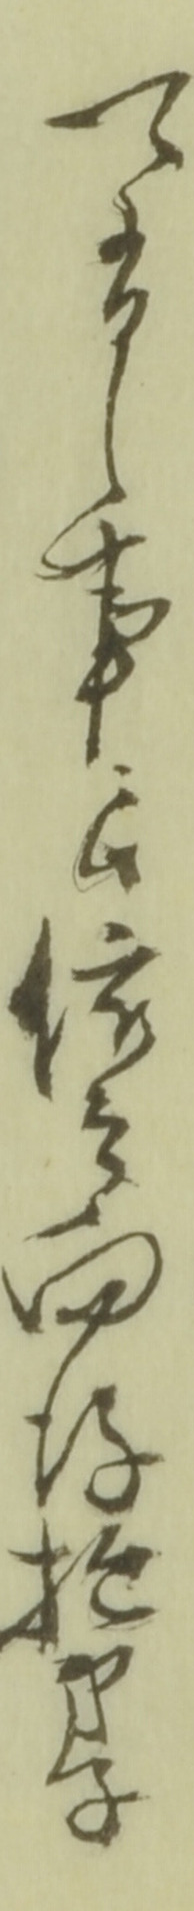可有之琴に候依之向後抱弟子
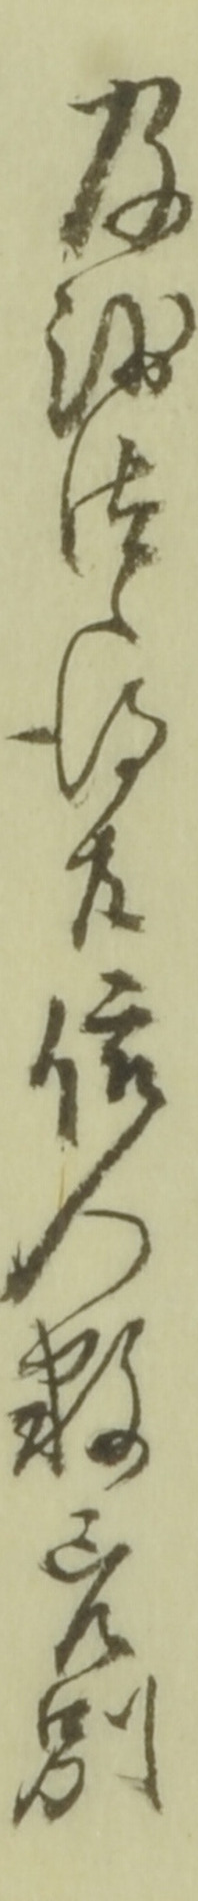及趣汰候得共依人数差別
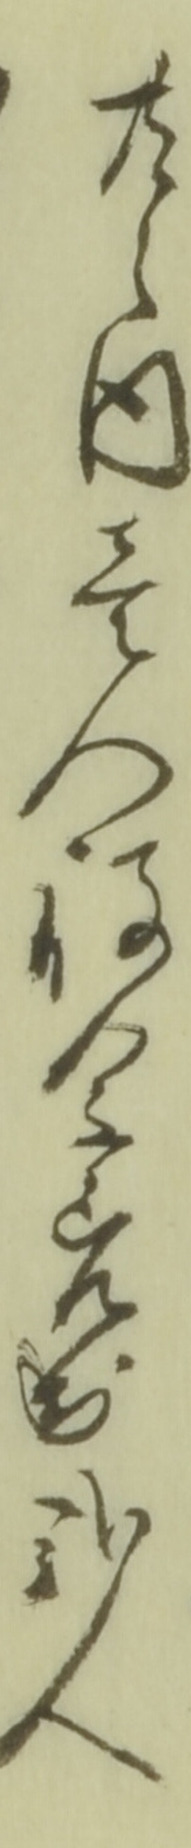共之内壱人役金差出弐人
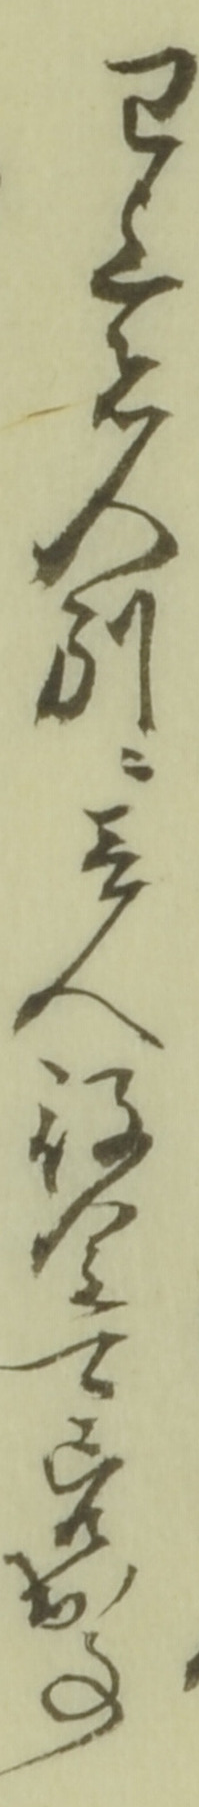已上者人別二壱人役金可差出事
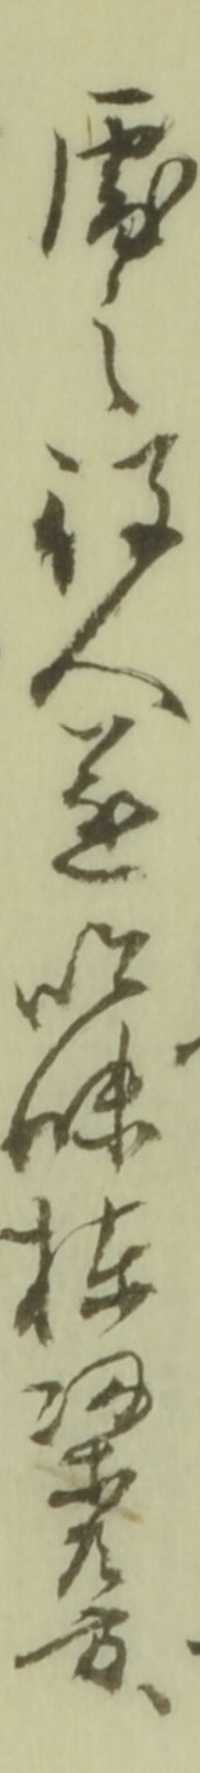處之役人遂吟味棟梁方へ
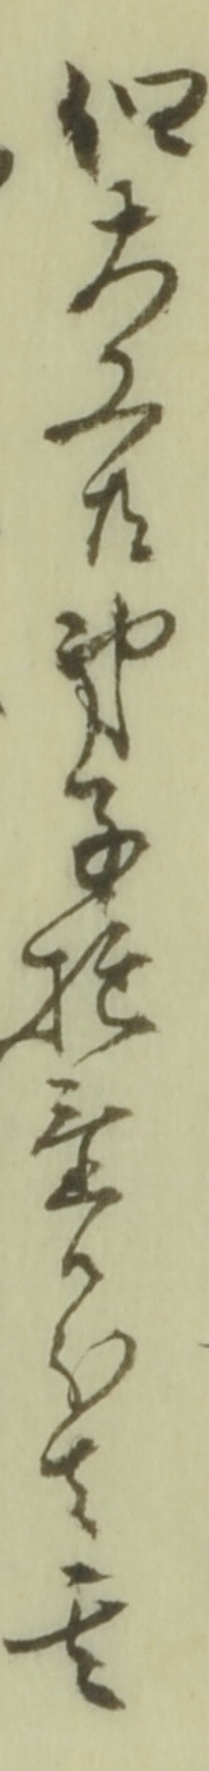但大工共弟子抱置候義者其
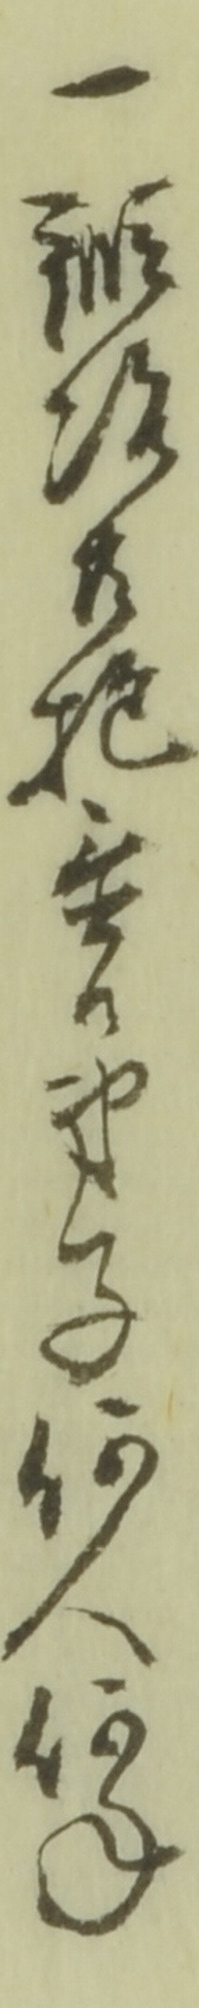一鍛冶共抱置候弟子何人何年
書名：御公儀様御領主様御触書控
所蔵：伊那市立高遠町図書館・合同会社AMANE
